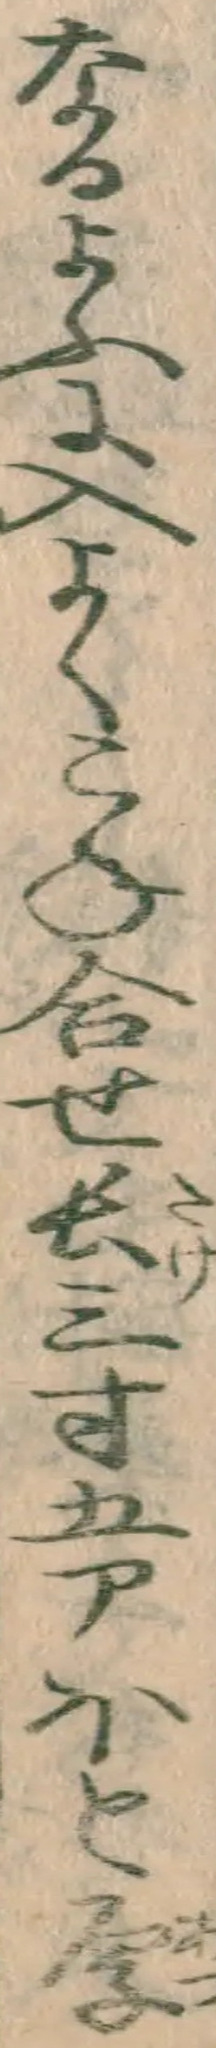なるよふに入よくこね合せ長三寸五部ほと厚
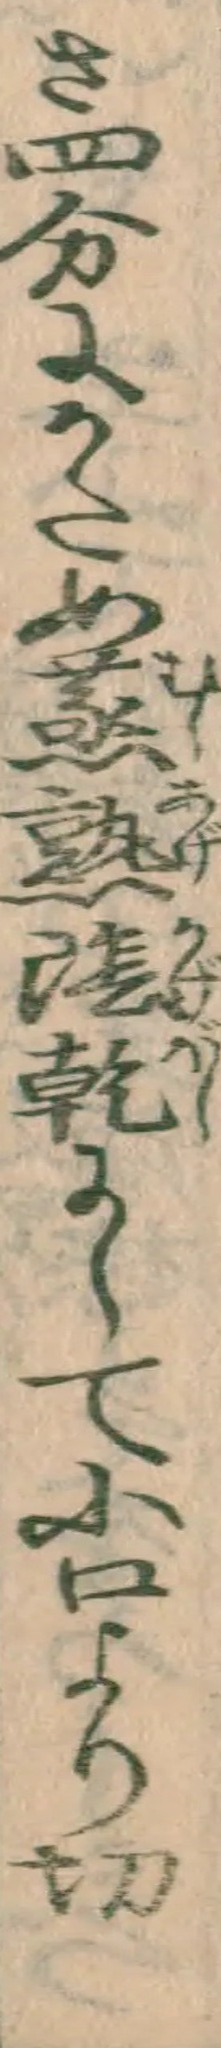さ四分にかため蒸熟陰乾にして小口より切
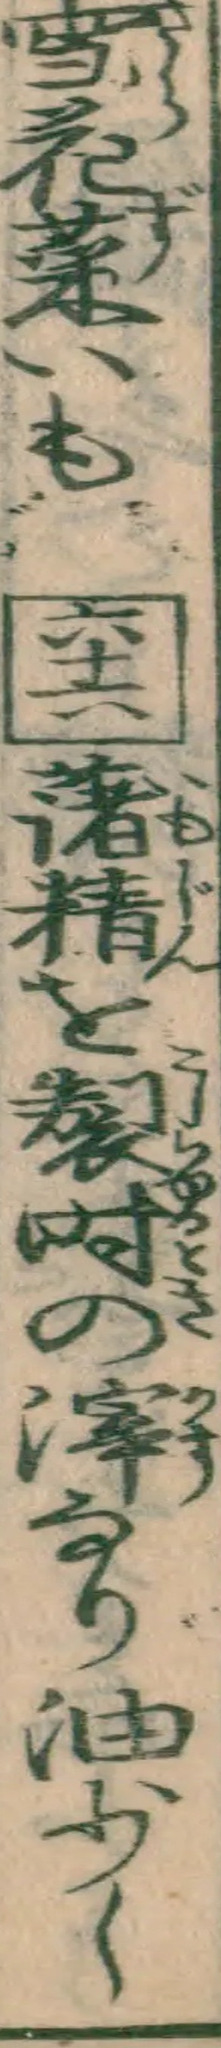[百三]雪花菜いも[六十六]藷精を製時の滓なり油少し
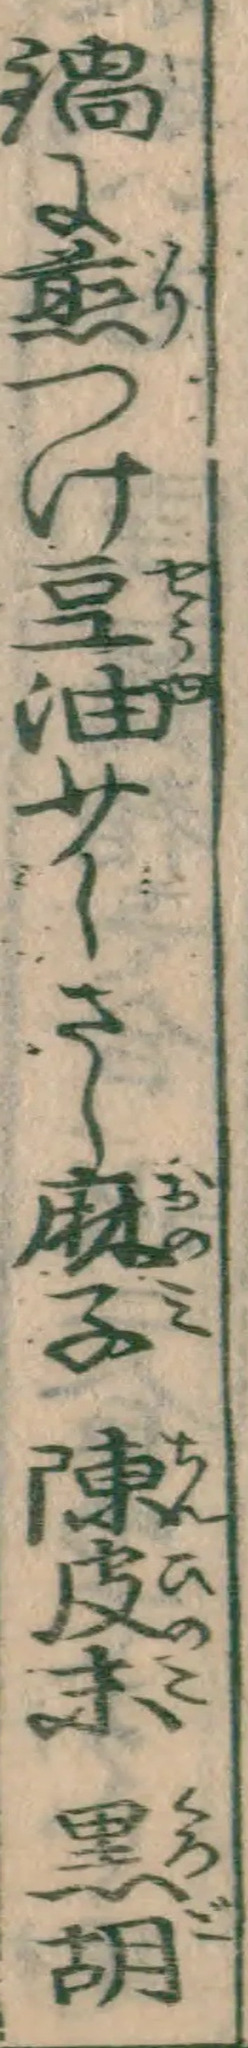鍋に煎つけ豆油少しさし麻子陳皮末黒胡
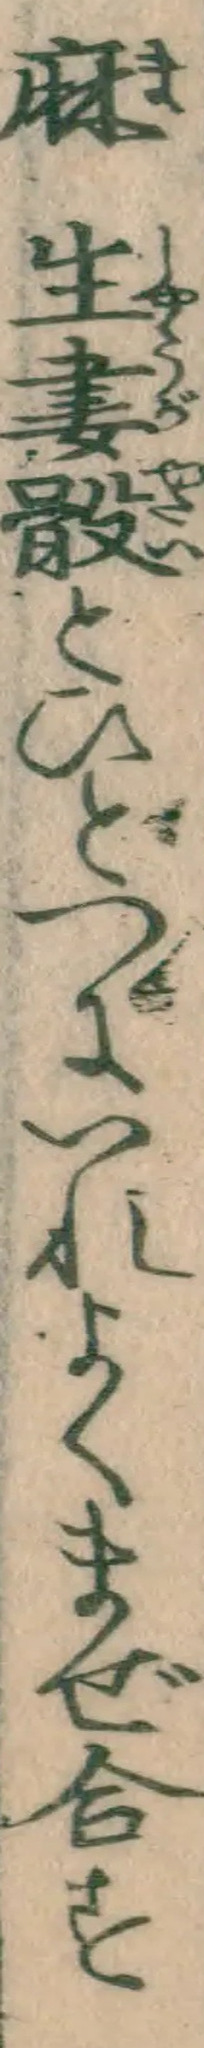麻生姜骰とひとつにいれよくまぜ合す
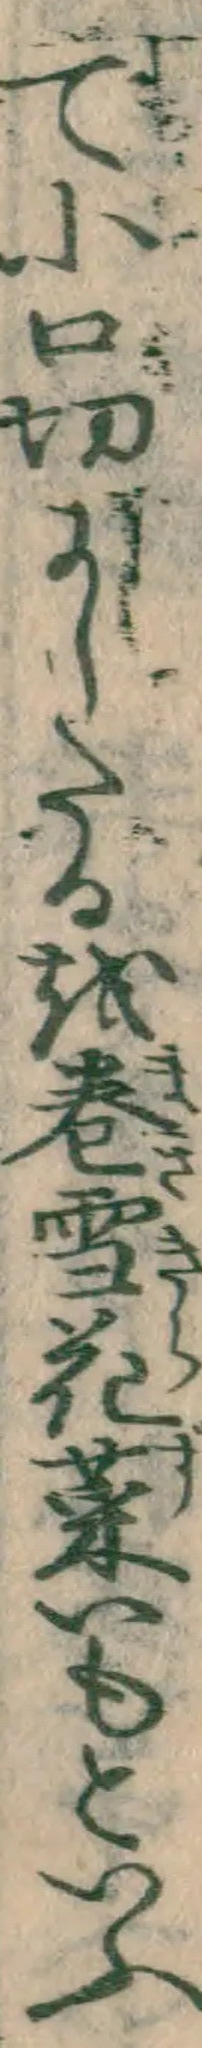て小口切にしたるを巻雪花菜いもといふ
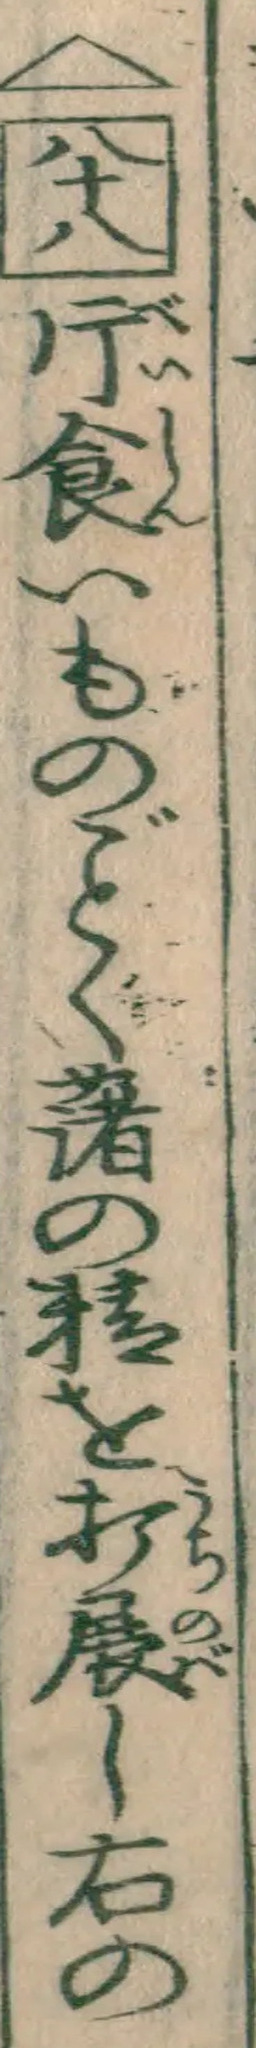△[八十八]斤食いものごとく藷の精を打展し右の
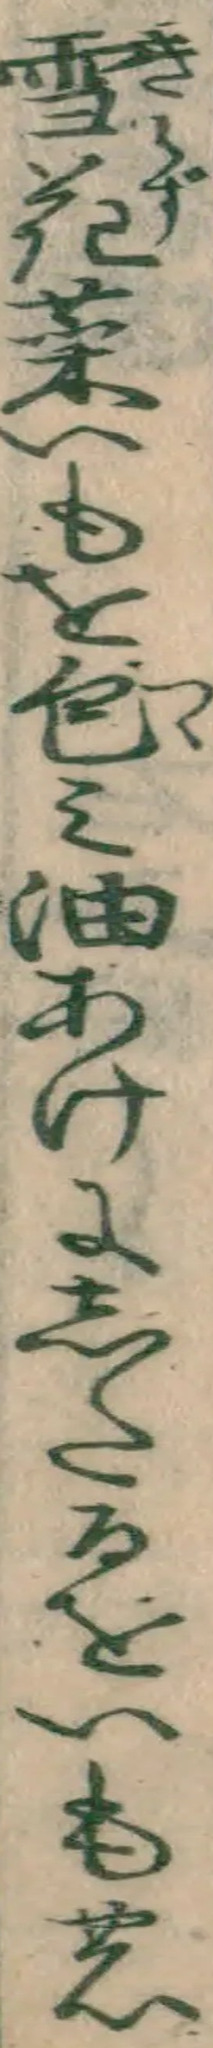雪花菜いもを包み油あけにしたるをいもの
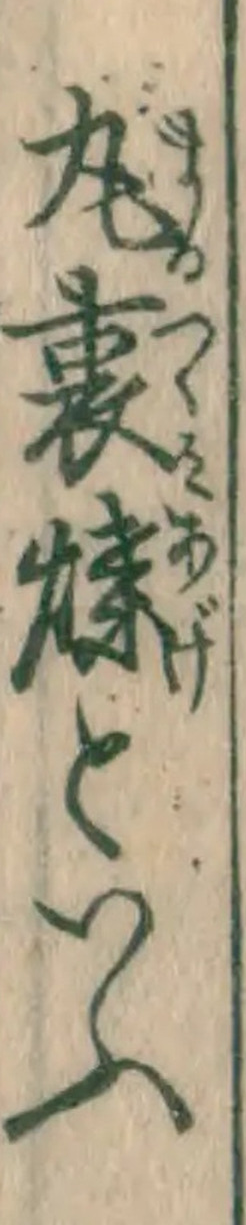丸裹煠といふ

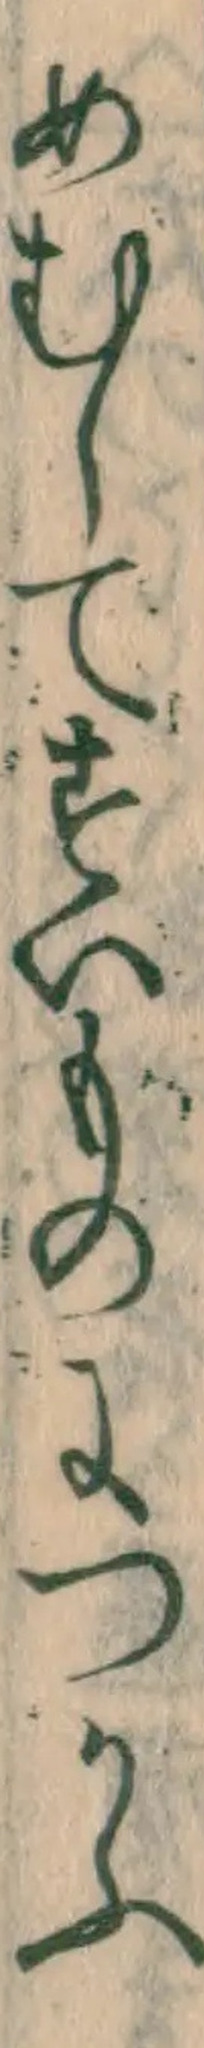めむしてすいものにつかふ
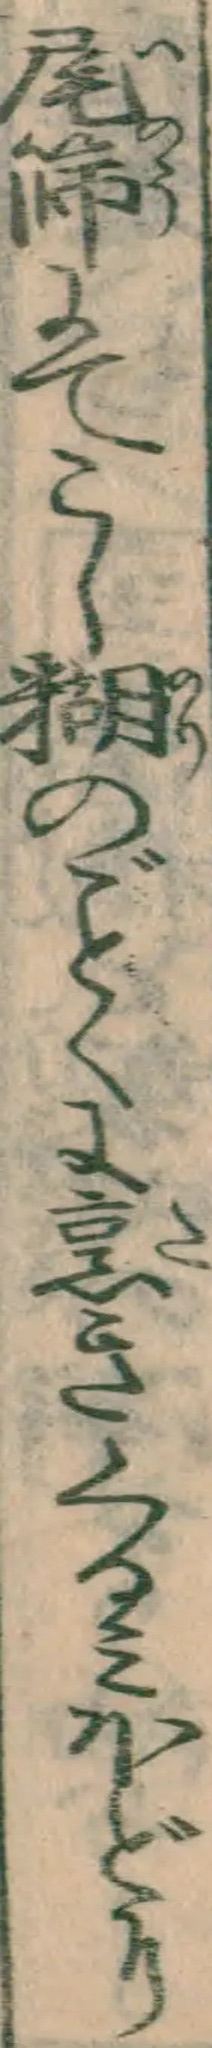尾篩にてこし糊のごとく烹きくるみほどに
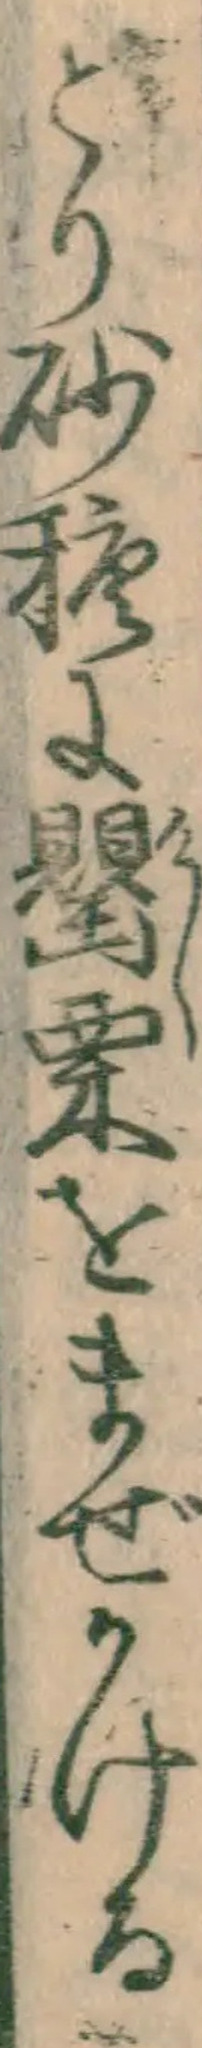とり砂糖に罌粟をまぜかける
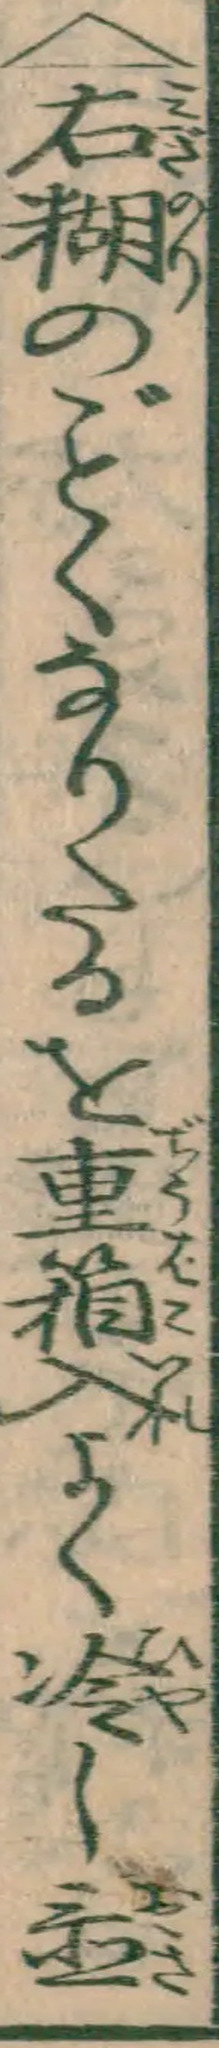△右糊のごとくなりたるを重箱入よく冷し置
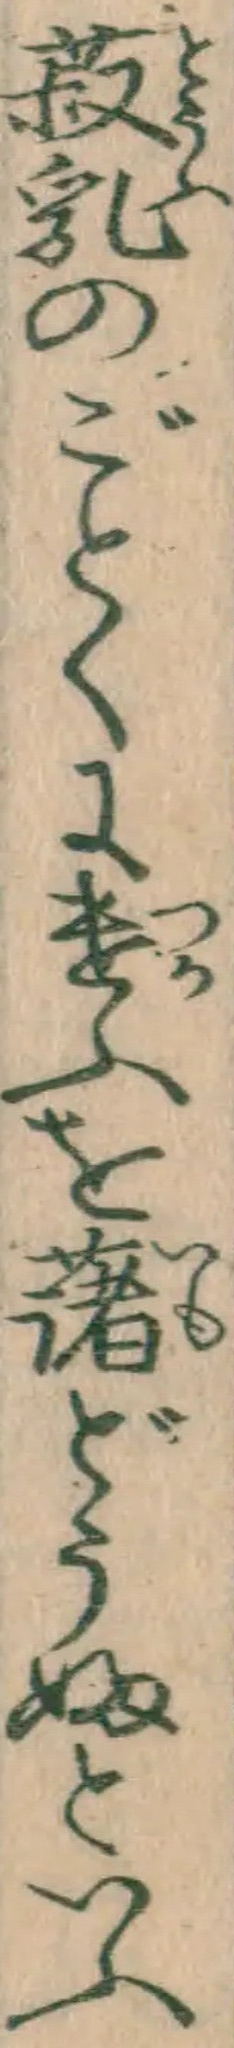菽乳のごとくに遣ふを藷どうふといふ
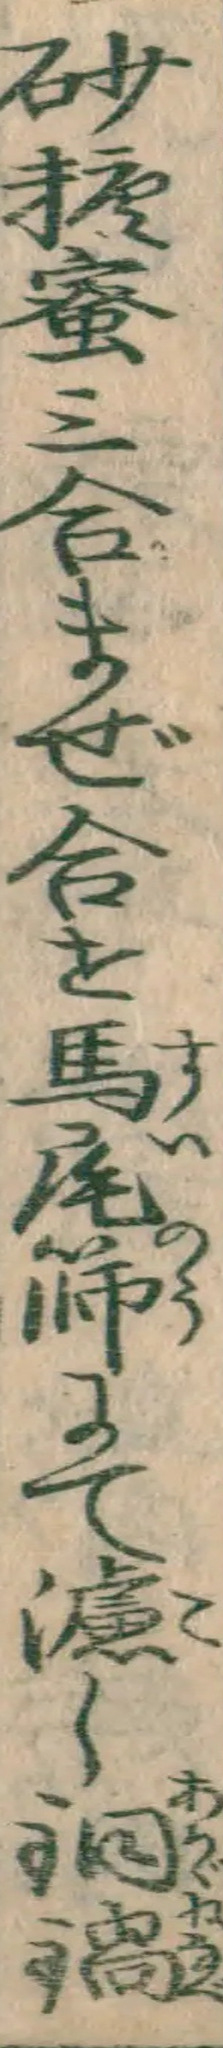砂糖蜜三合まぜ合せ馬尾篩にて濾し銅鍋
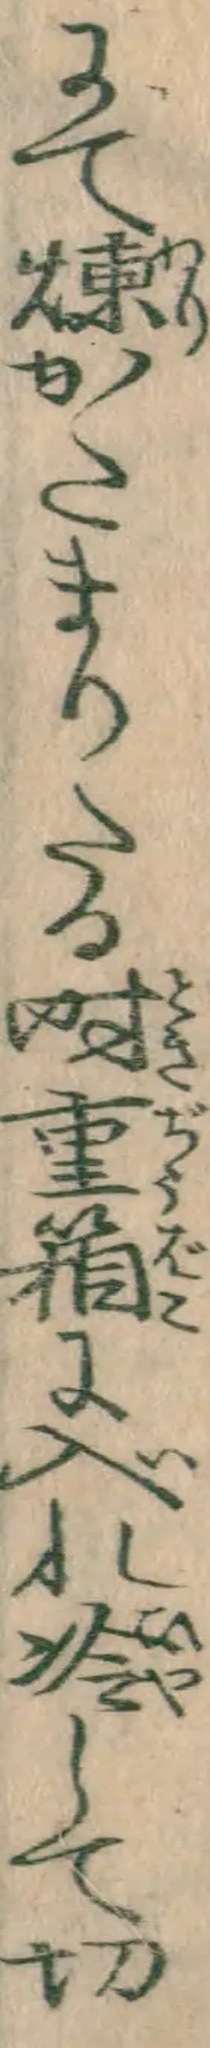にて練かたまりたる時重箱に入れ冷して切
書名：甘藷百珍
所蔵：国立国会図書館 National Diet Library, JAPAN
